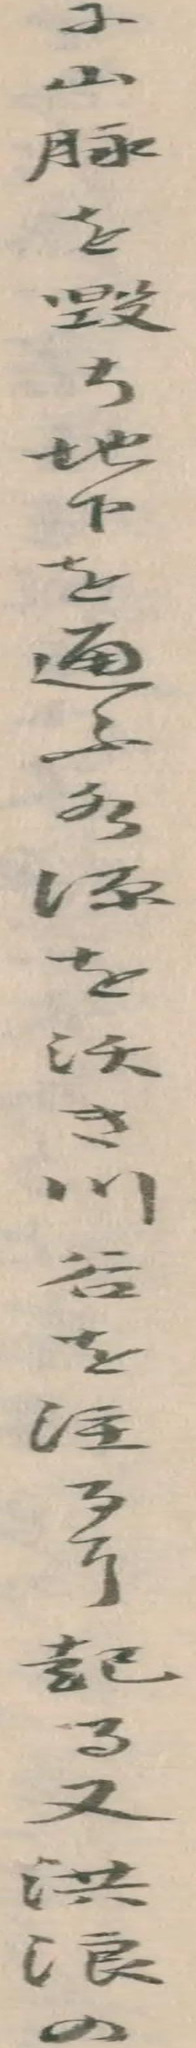に山脈を毀ち地下を通ふ水源を沃き川谷を注るに起る又洪浪の
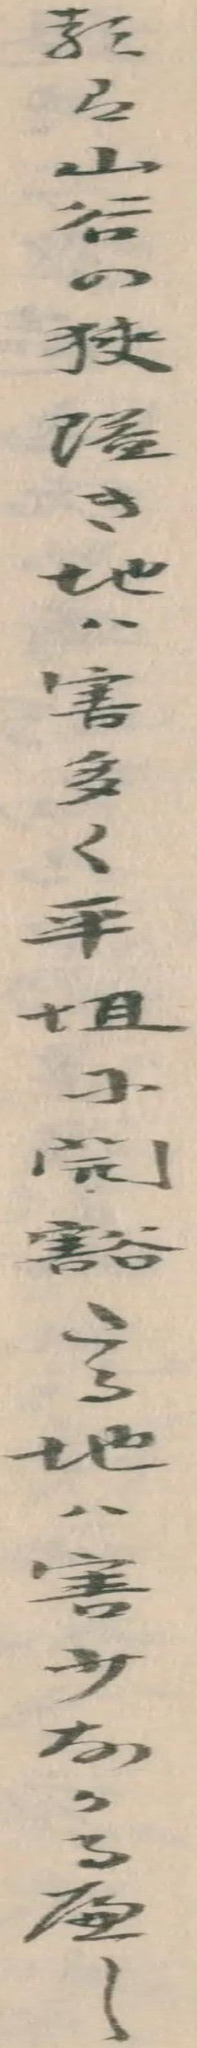類は山谷の狭隘き地は害多く平坦に開豁たる地は害少なかるへし
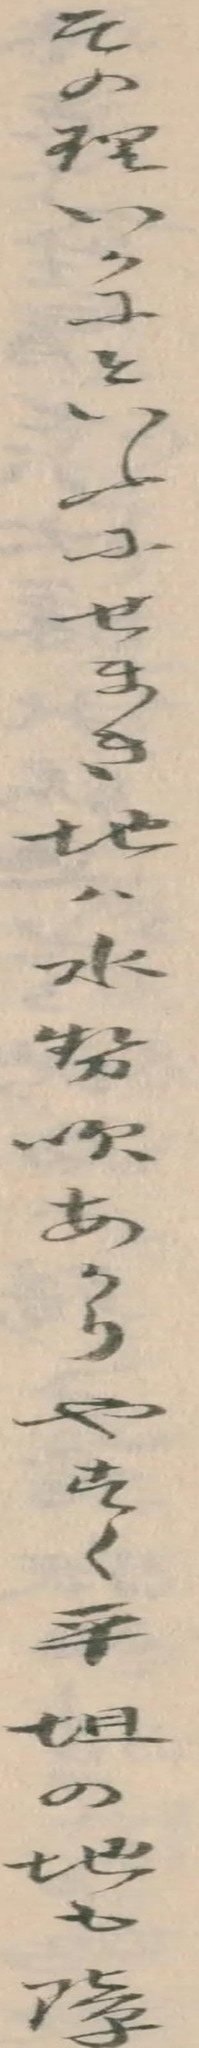その理いかにといふにせまき地は水勢吹あかりやすく平坦の地も障
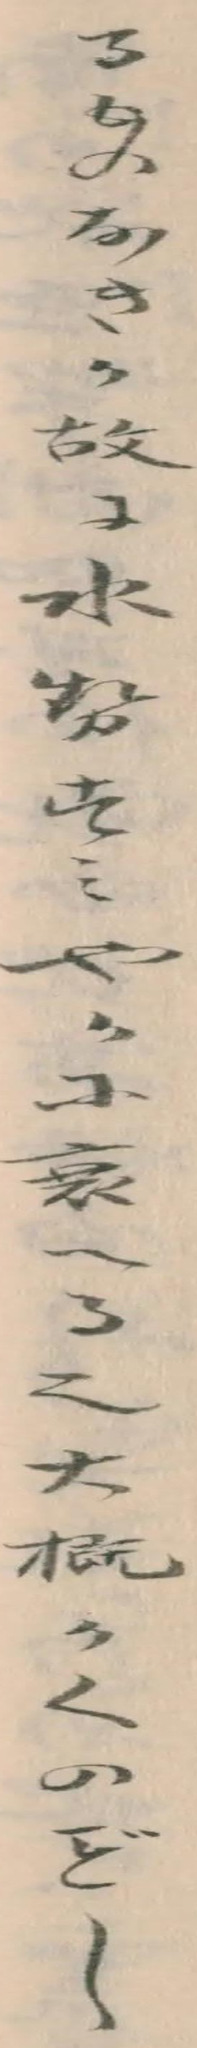るものなきか故に水勢すみやかに衰へる也大概かくのごとし
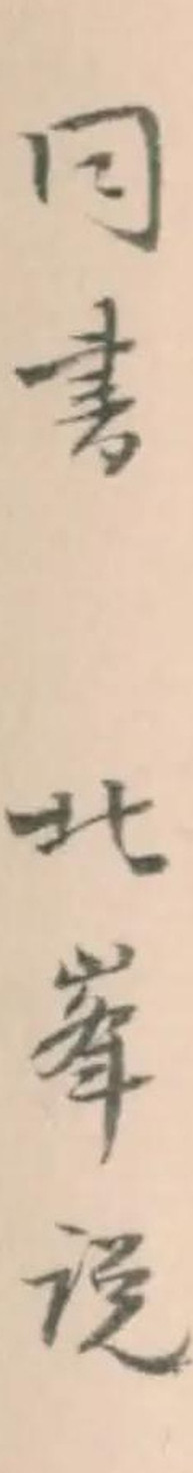同書北峯説
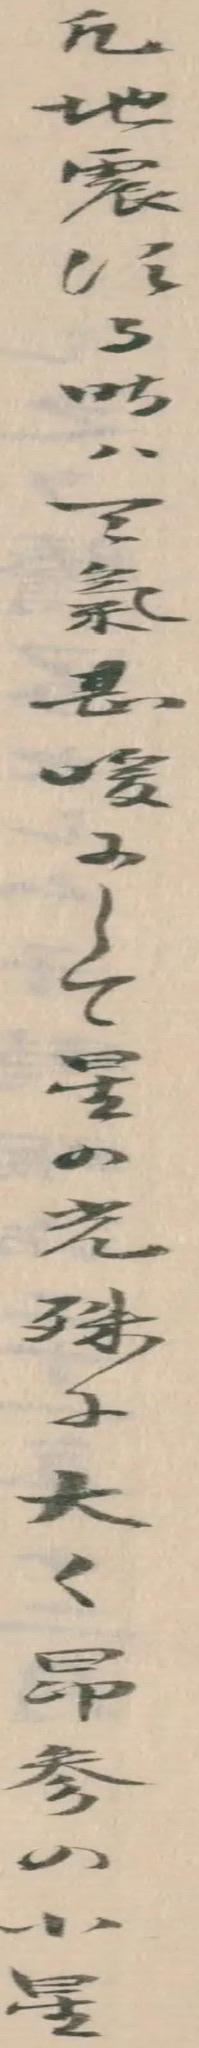凡地震する時は天気甚暖にして星の光殊に大く昴参の小星
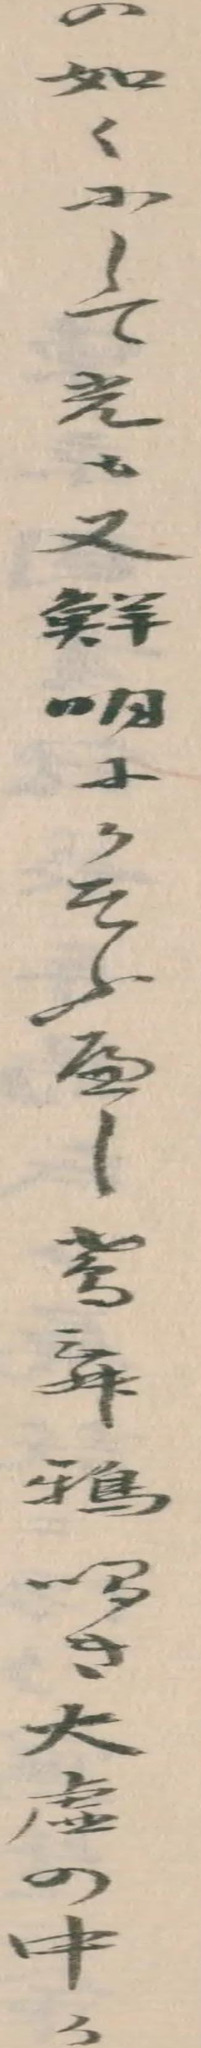の如くにして光も又鮮明にかそふへし鳶舞鴉鳴き大虚の中か
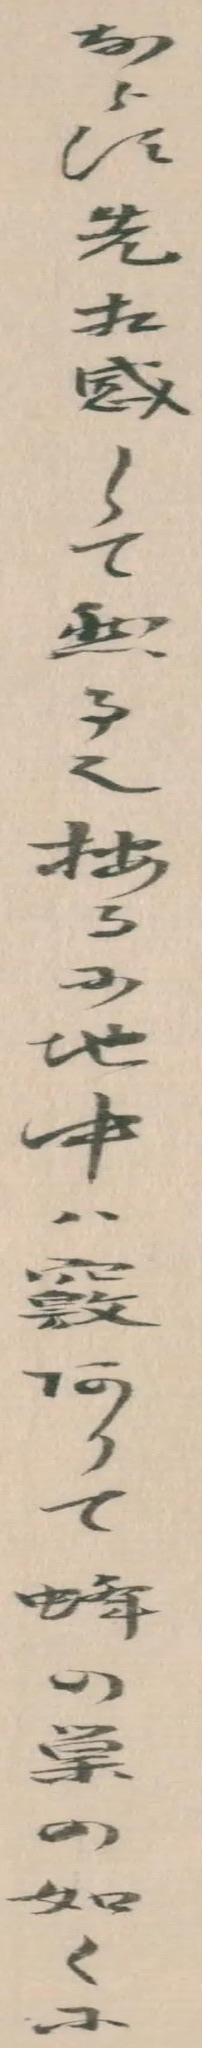ならす先相感して然る也按るに地中は竅ありて蜂の巣の如くに
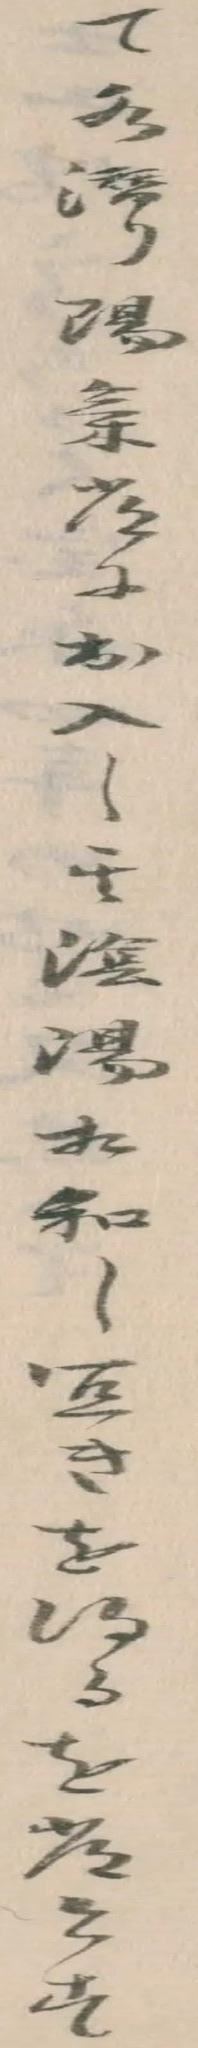て水潜り陽気常に出入し其陰陽相和し宜きを得るを常とす
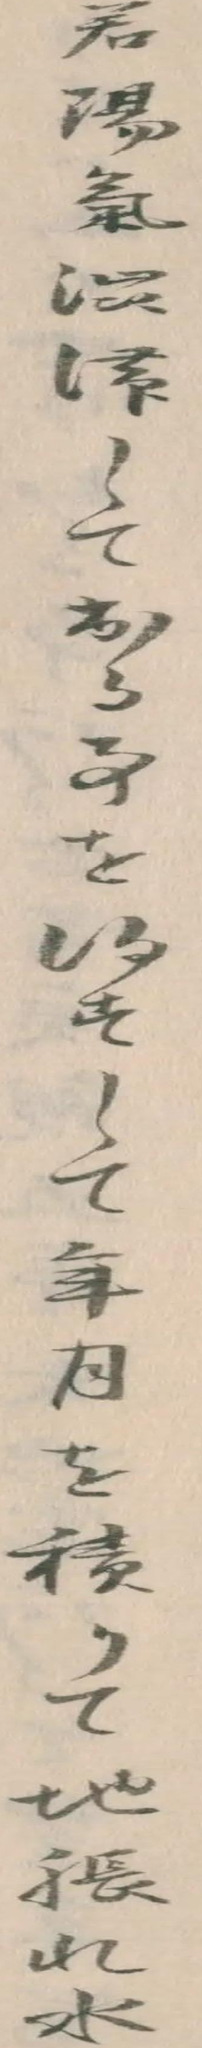若陽気渋滞して出る事を得すして年月を積りて地脹れ水
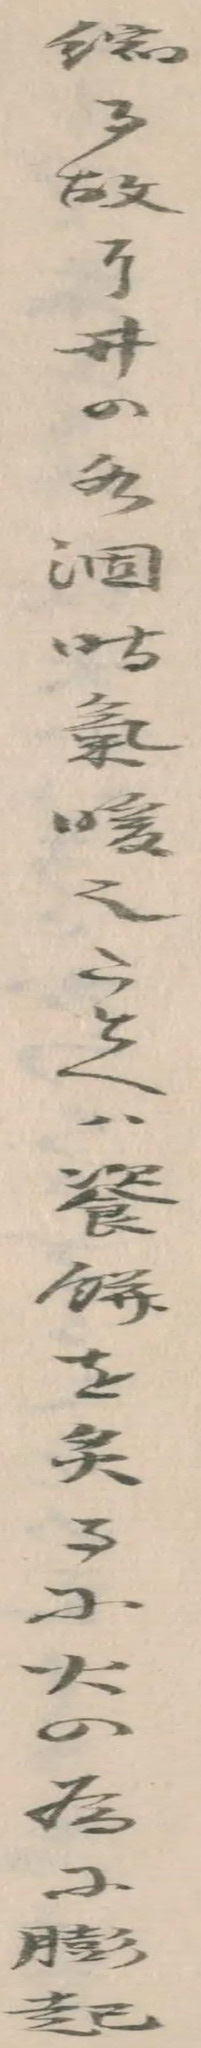縮る故に井の水涸時気暖也たとへは餐餅を炙るに火の為に膨起
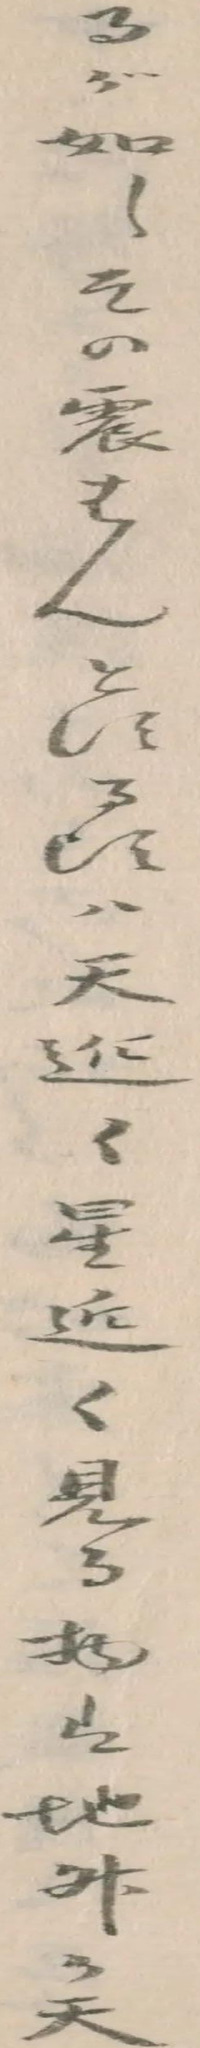るが如しその震はんとする頃は天近く星近く見る物は地升か天
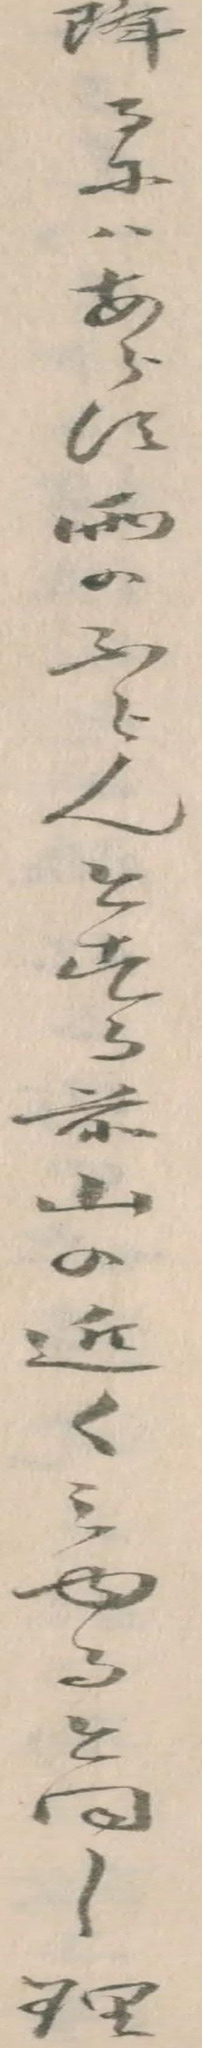降るにはあらす雨のふらんとする前山の近くみゆると同じ理
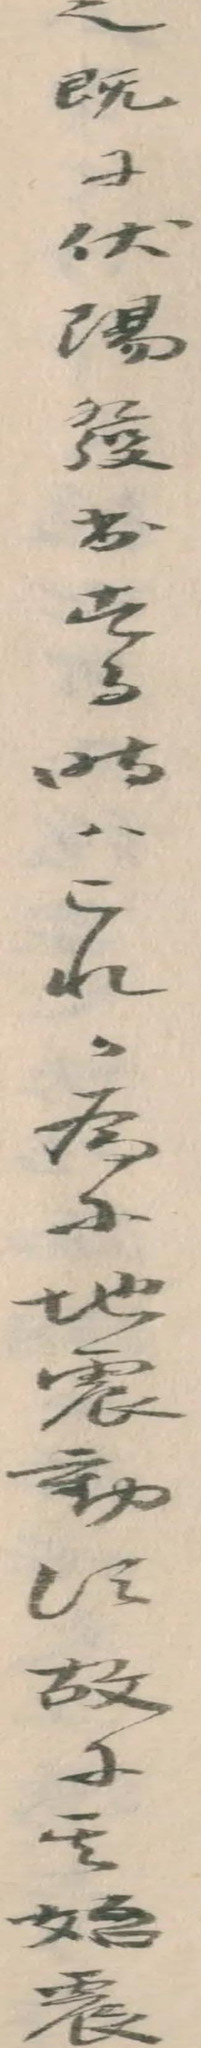也既に伏陽発出する時はこれか為に地震動す故に其始震

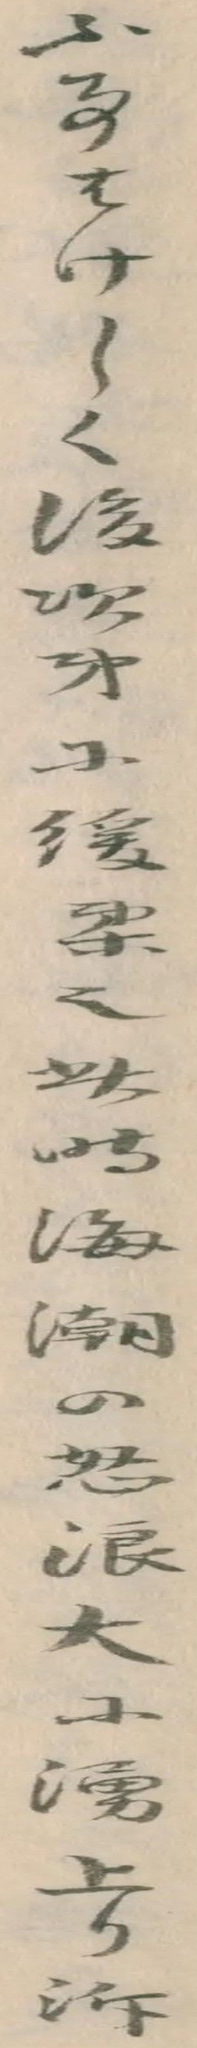ふ事はけしく後次第に緩繫也此時海潮の怒浪大に湧き上り泝
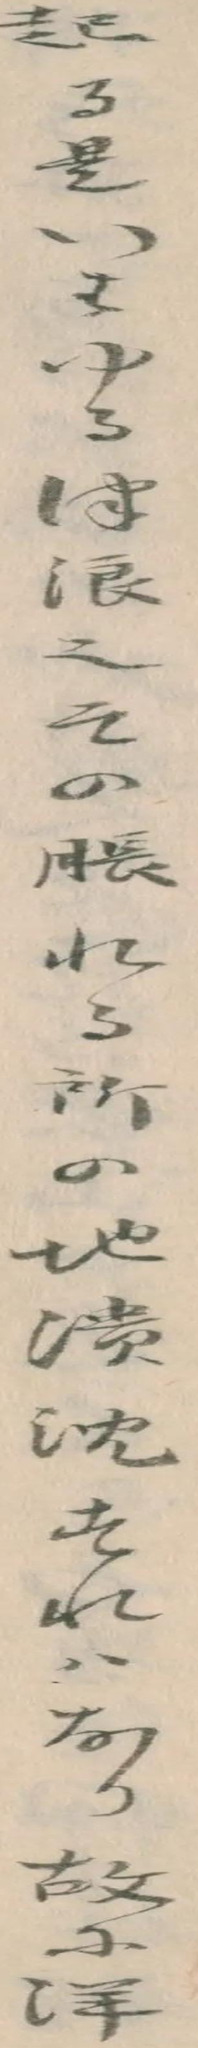起る是いはゆる津浪也その脹れる所の地潰沈すれはなりゆ故に洋
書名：地災撮要. 巻10(地震之部) 上,下
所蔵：国立国会図書館 National Diet Library, JAPAN
